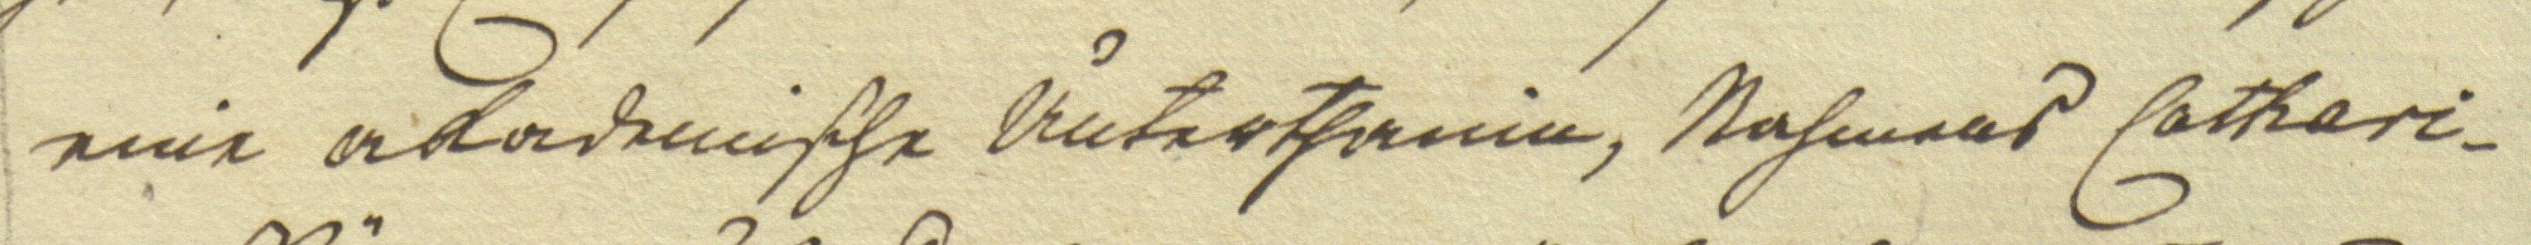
eine akademische Unterthanin, Nahmens Cathari¬
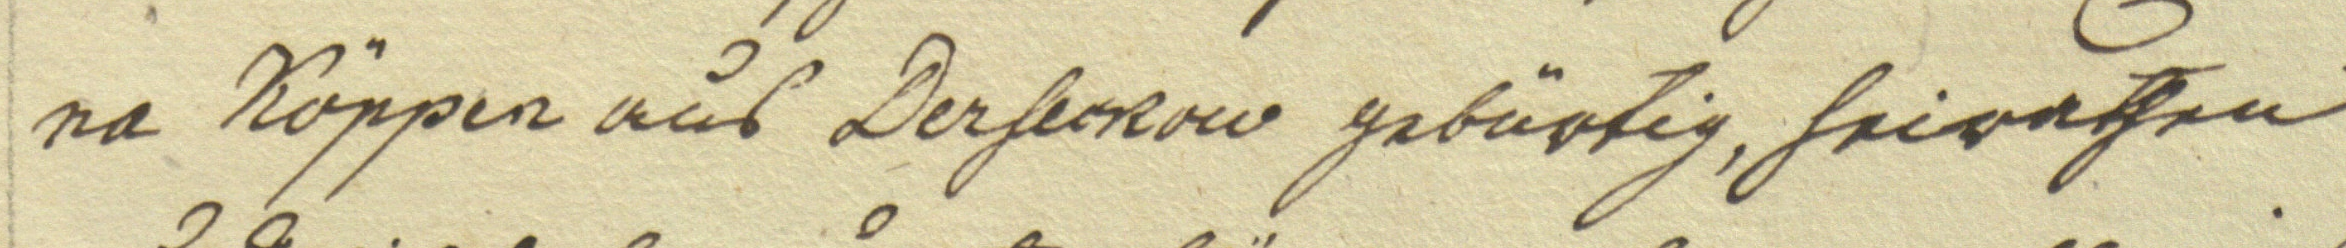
na Köppen aus Derseckow gebürtig, heirathen
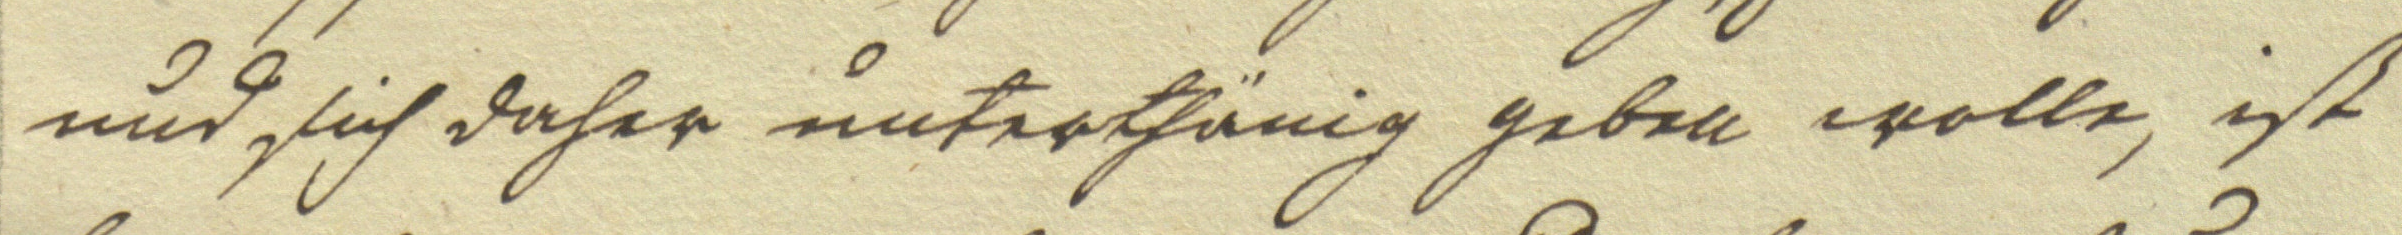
und sich daher unterthänig geben wolle, ist
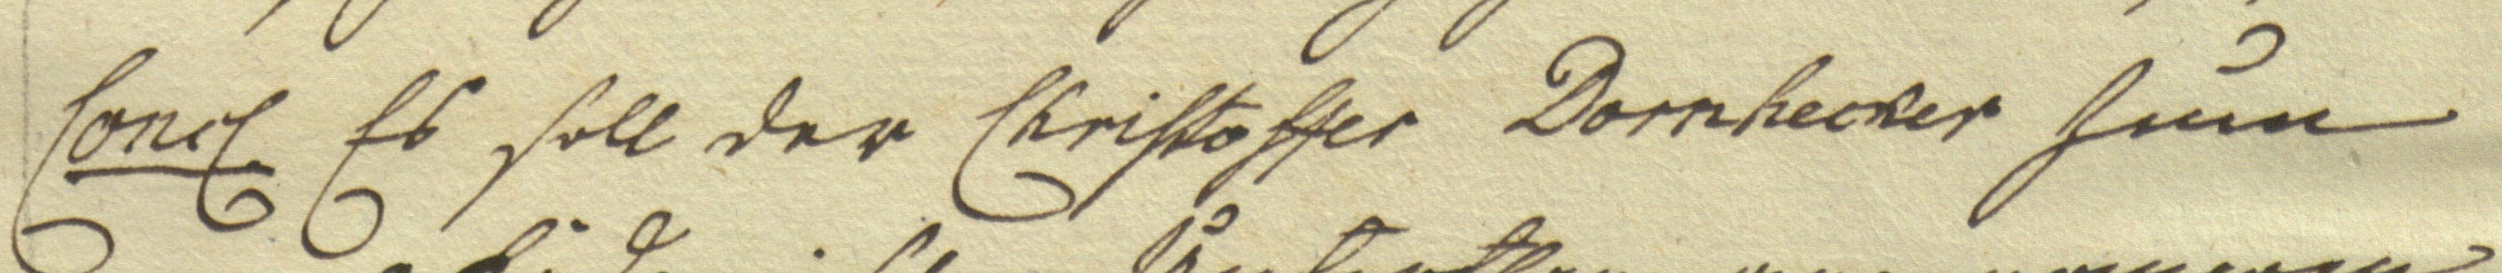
Concl. Es soll der Christoffer Dornhecker zum
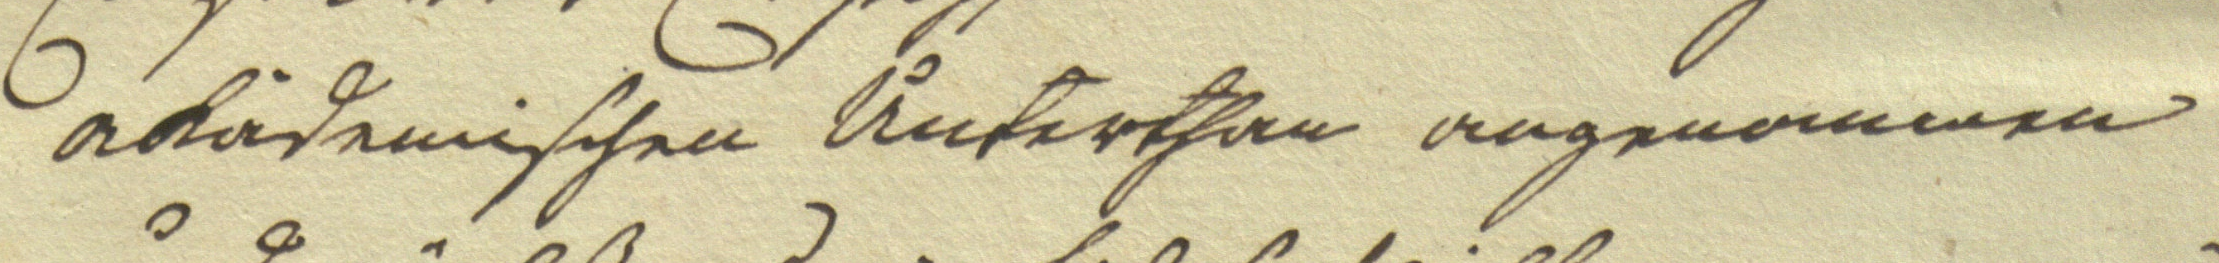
akademischen Unterthan angenommen
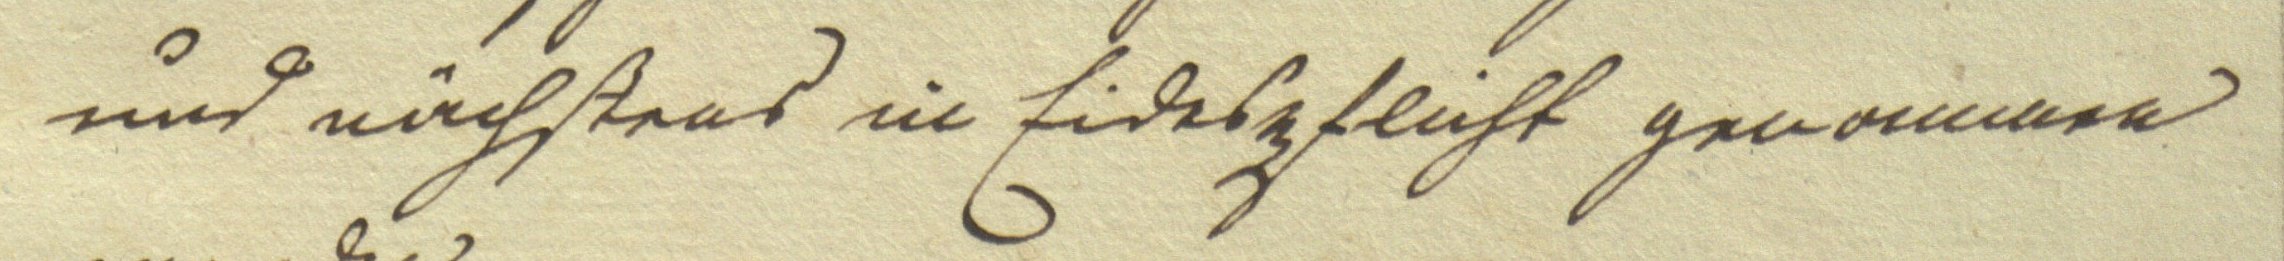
und nächstens in Eidespflicht genommen
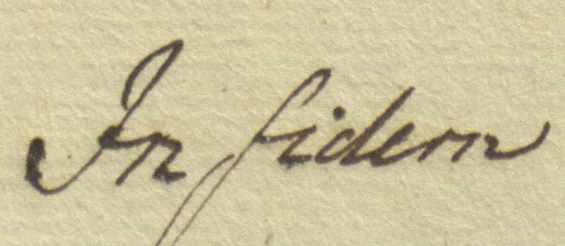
In fidem
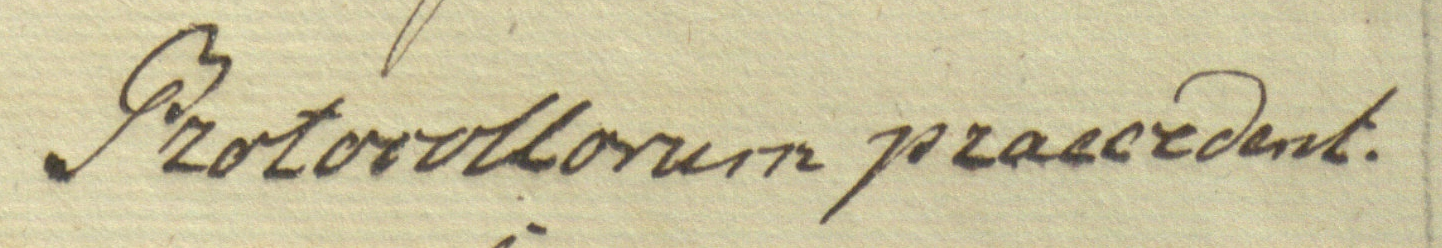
Protocollorum praecedent.
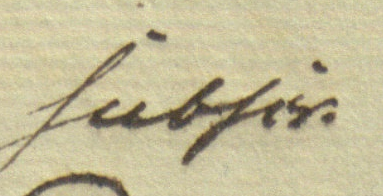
subscr.
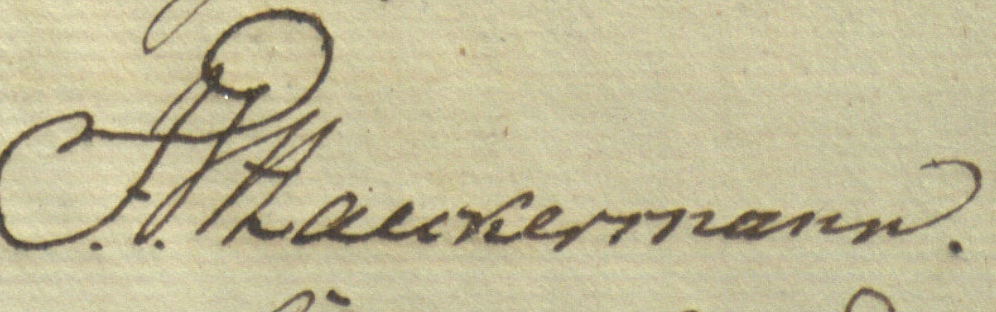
JG Haeckermann
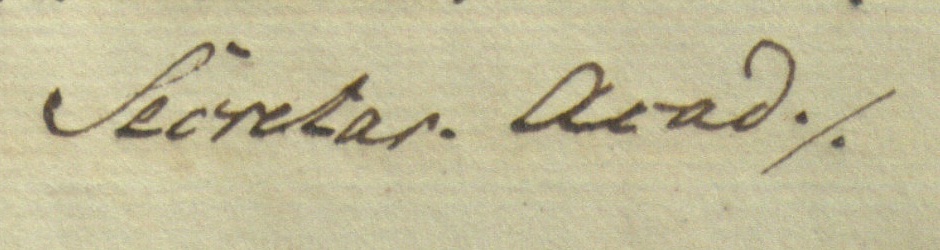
Secretar. Acad.
